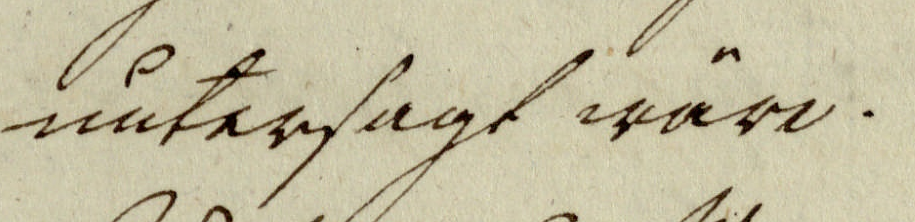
untersagt wäre.
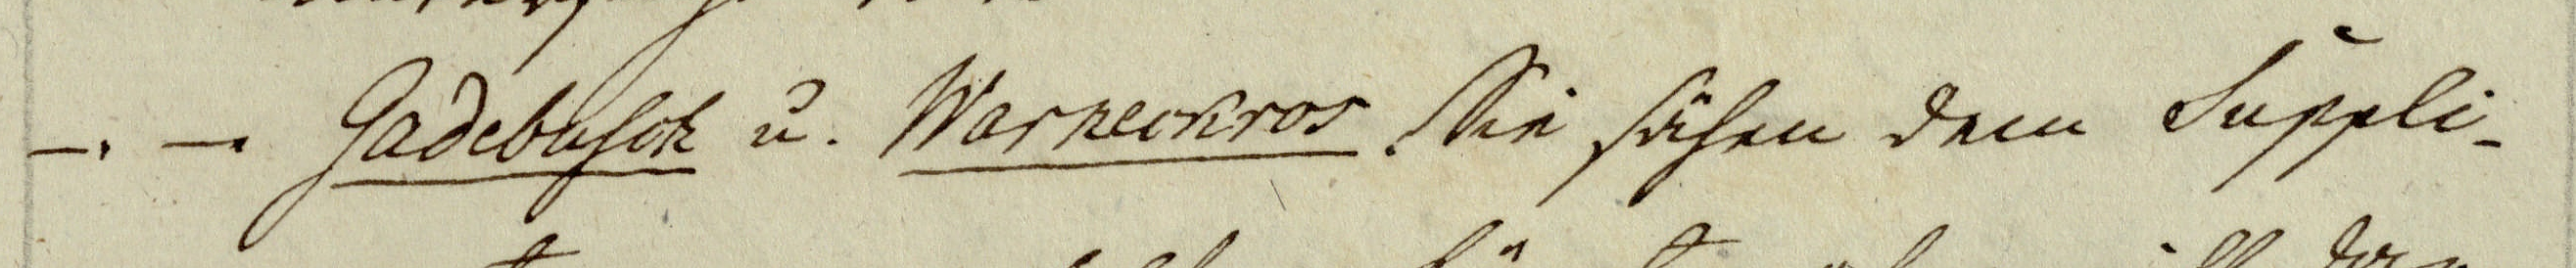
Gadebusch u. Warneckros. Sie sähen dem Suppli¬
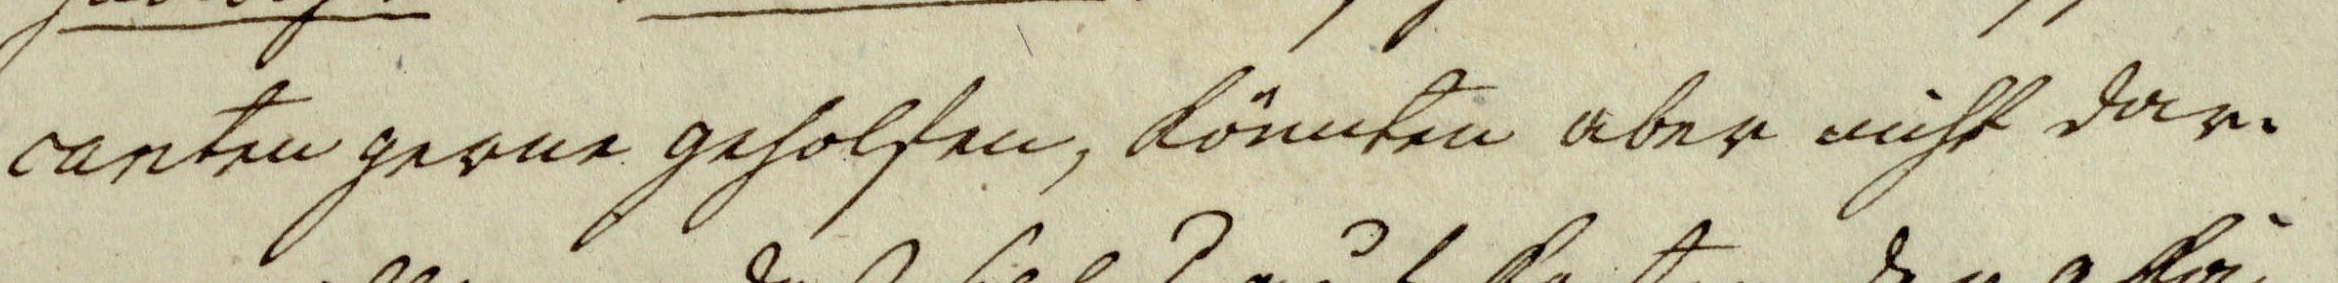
canten gerne geholfen, könnten aber nicht dar¬
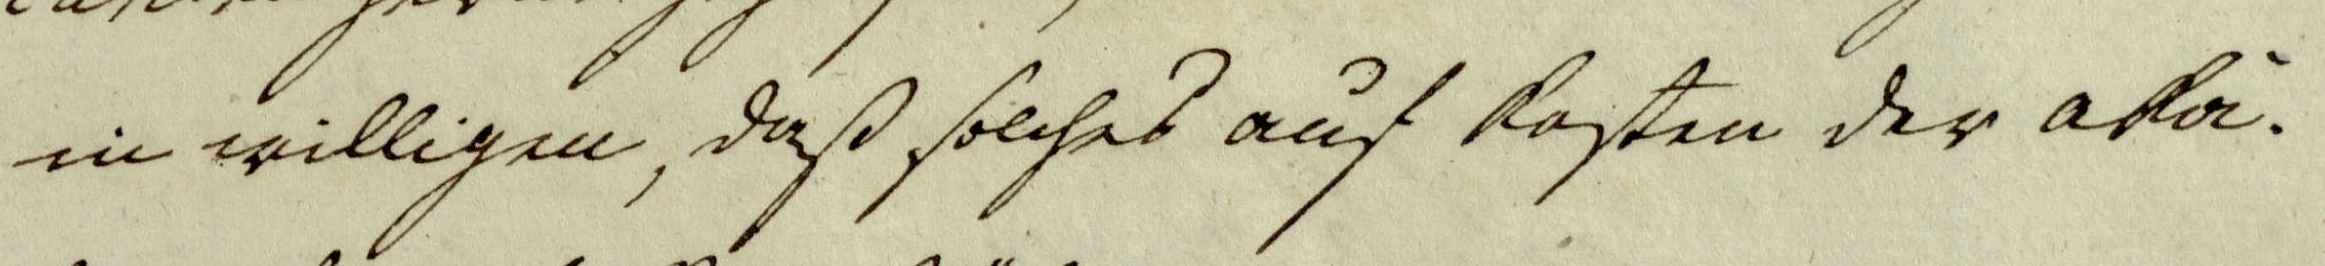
in willigen, daß solches auf Kosten der aka¬
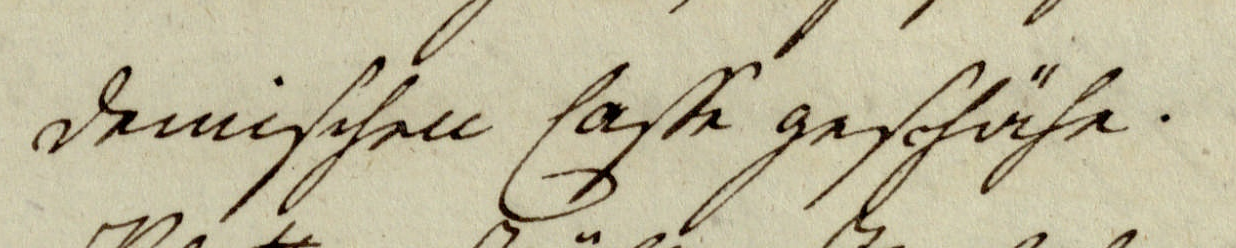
demischen Casse geschähe.
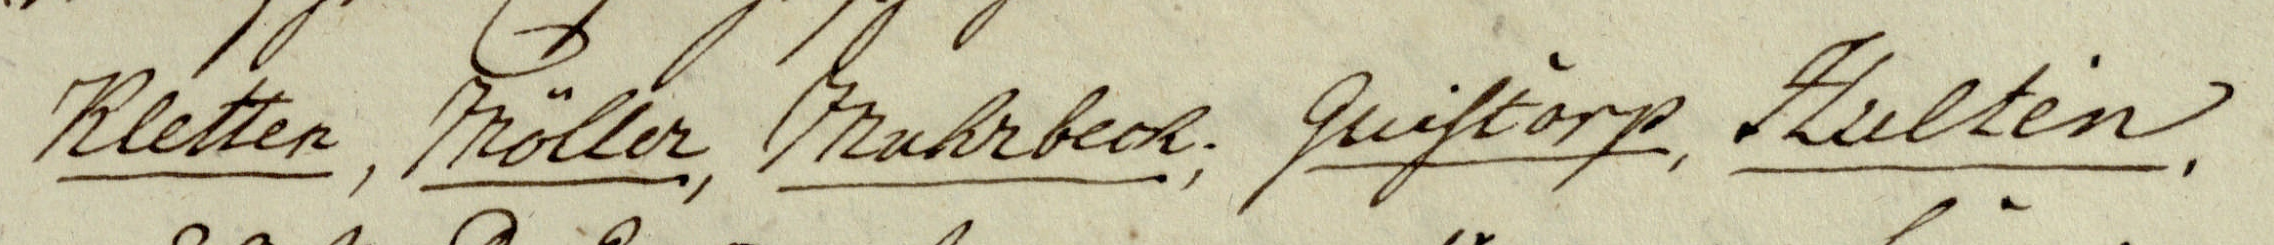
Kletten, Möller, Muhrbeck; Quistorp, Hultén,
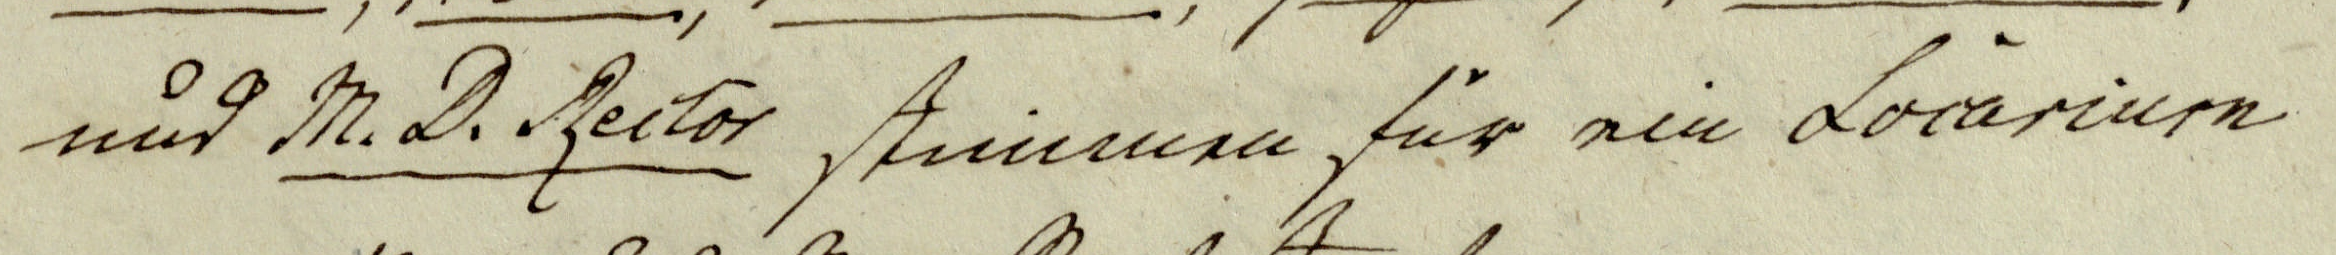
und M. D. Rector stimmen für ein Locarium
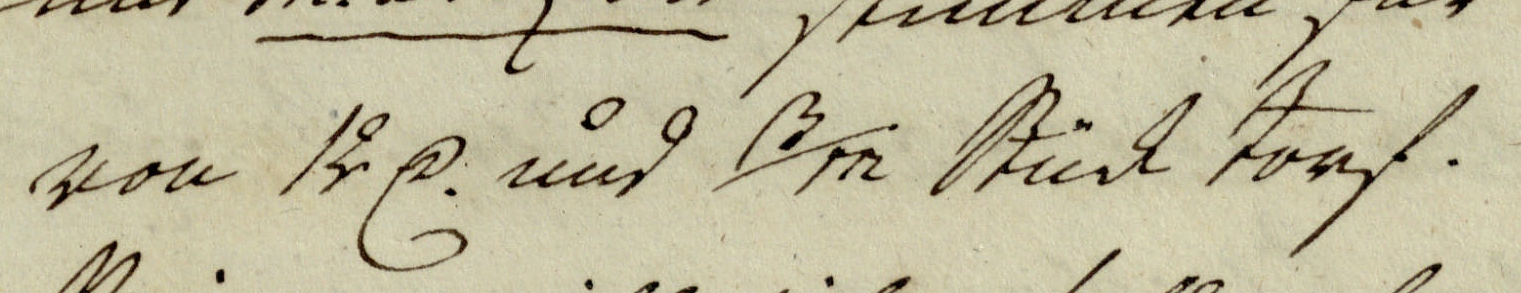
von 12. l. und 3/m Stück Torf.
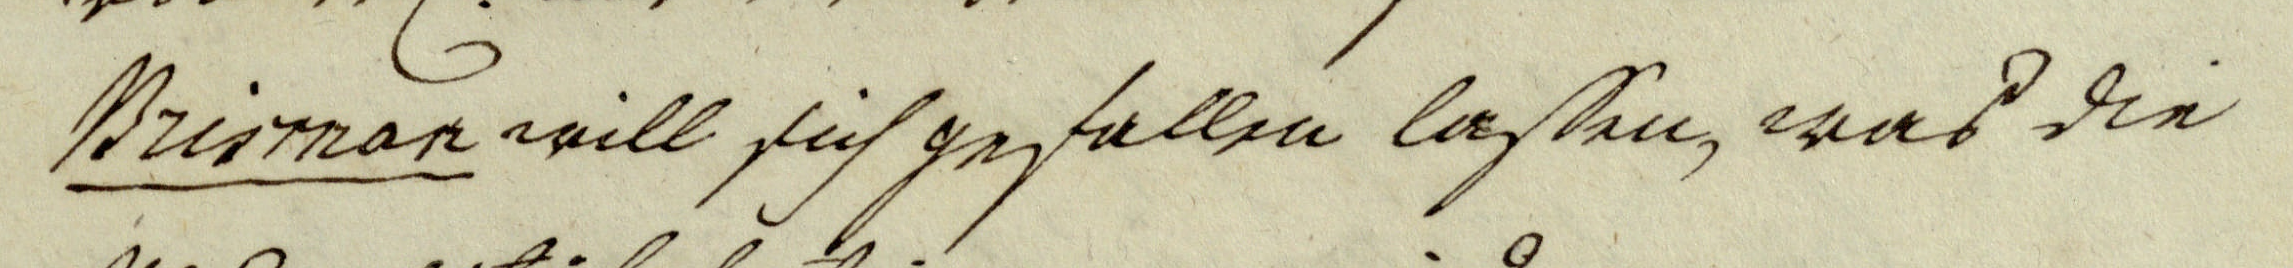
Brisman will sich gefallen lassen, was die
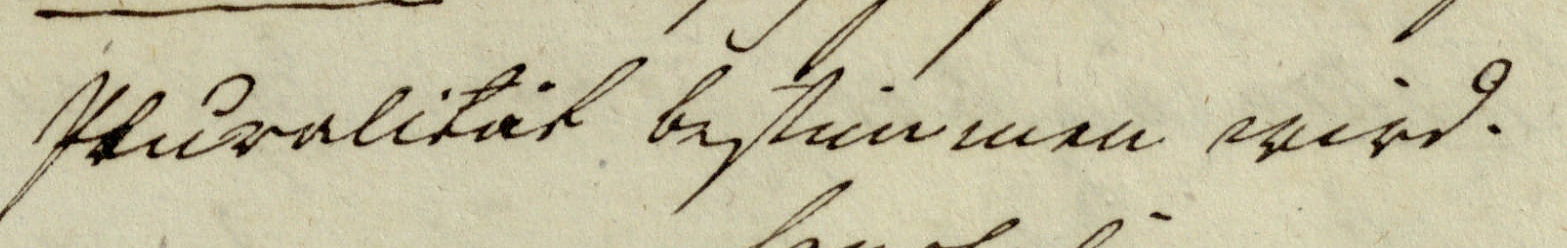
Pluralität bestimmen wird.
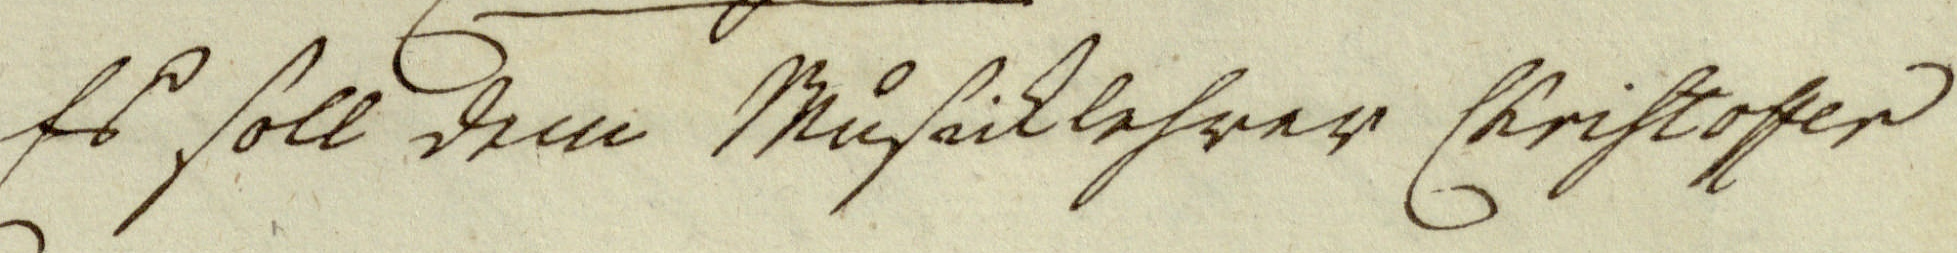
Es soll dem Musicklehrer Christoffer
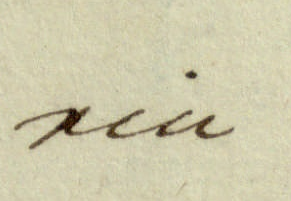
ein
